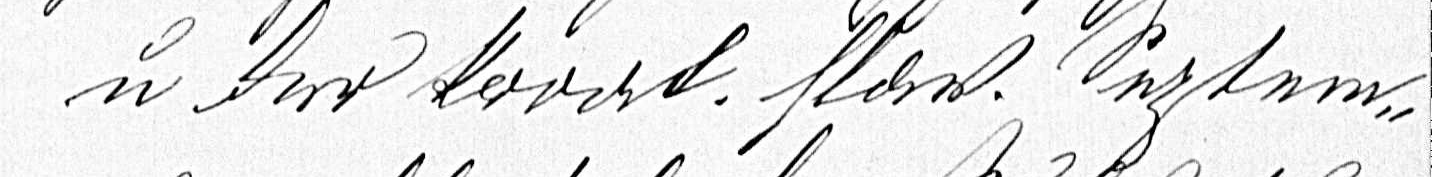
u der kroat. slav. Septem¬
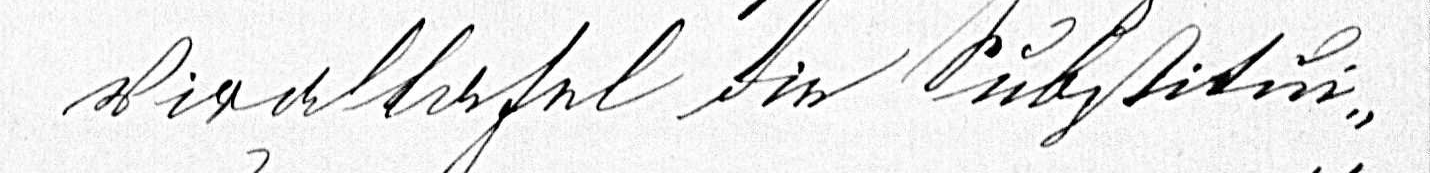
viraltafel die Substitui¬
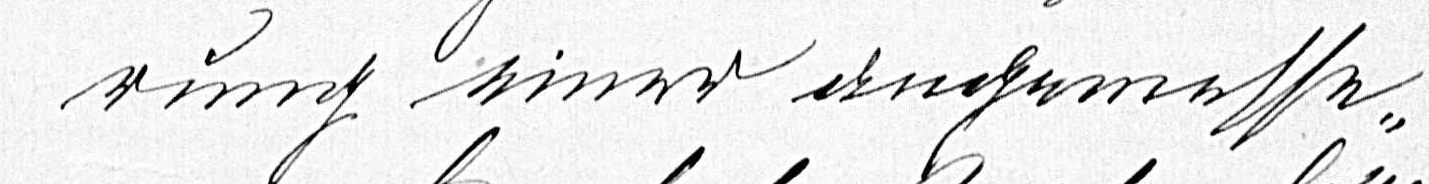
rung einer angemesse¬
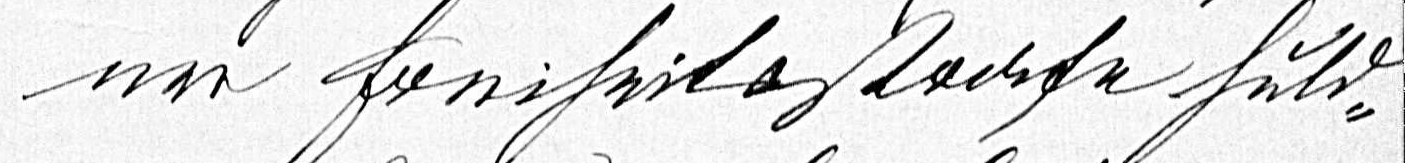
ner Freiheitsstrafe huld¬
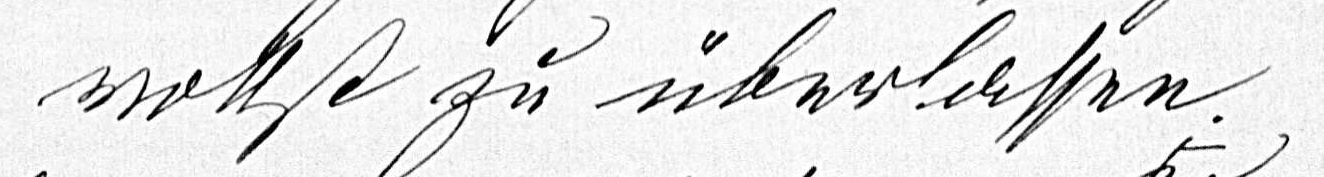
vollst zu überlassen.
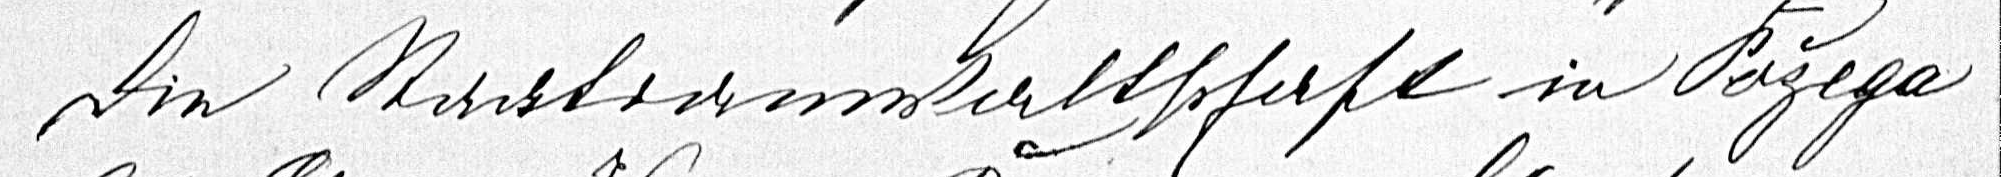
Die Staatsanwaltschaft in Požega
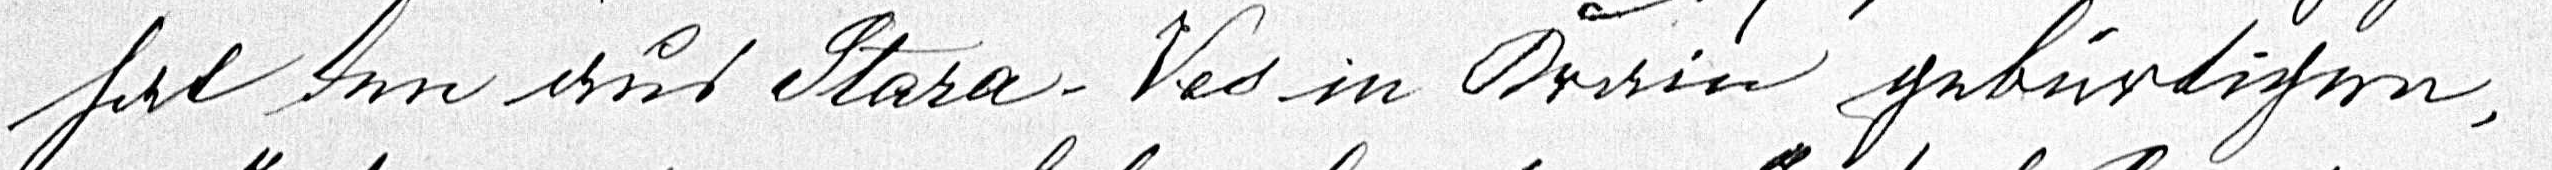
hat den aus Stara-Ves in Krain gebürtigen,
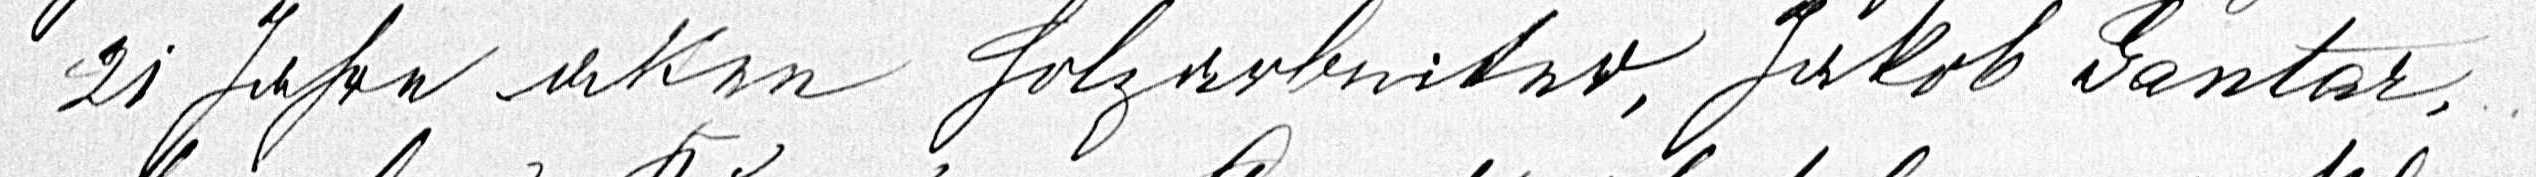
21 Jahre alten Holzarbeiter, Jakob Gantar,
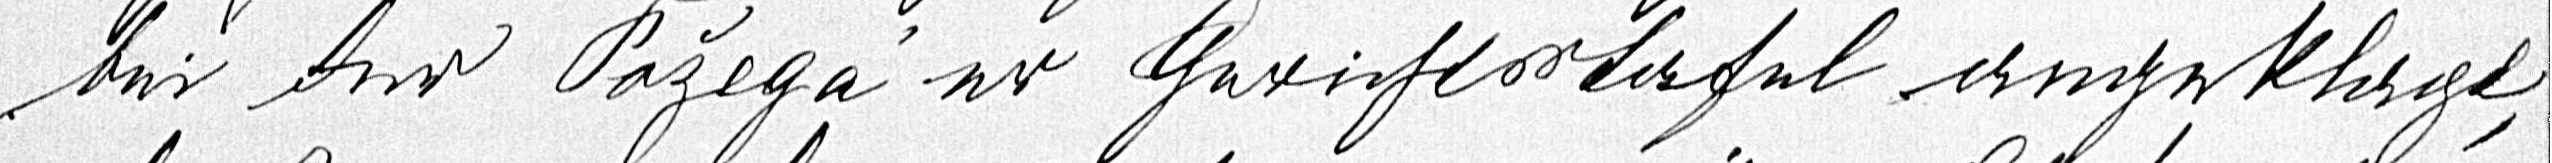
bei der Požega’er Gerichtstafel angeklagt,
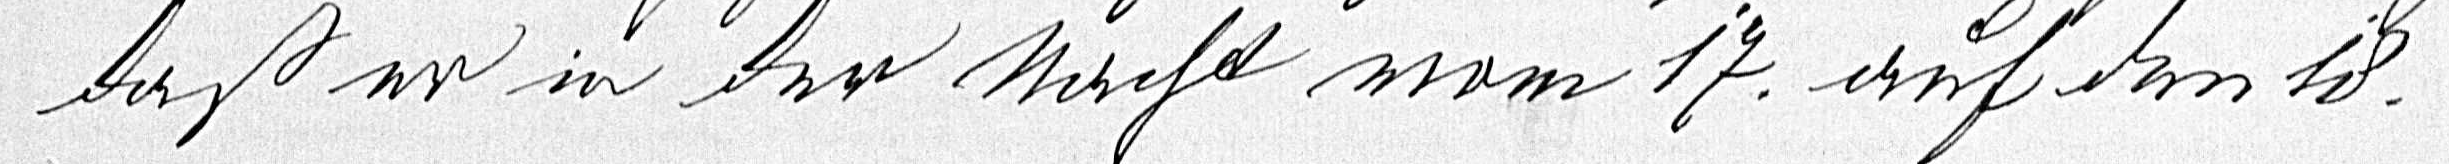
daß er in der Nacht vom 17. auf den 18.
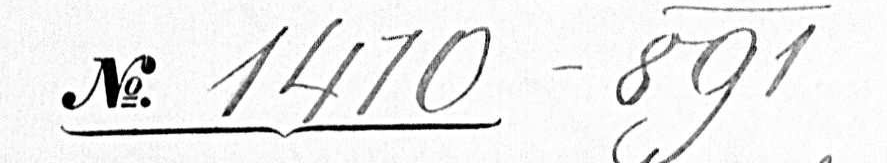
No. 1410 – 1891
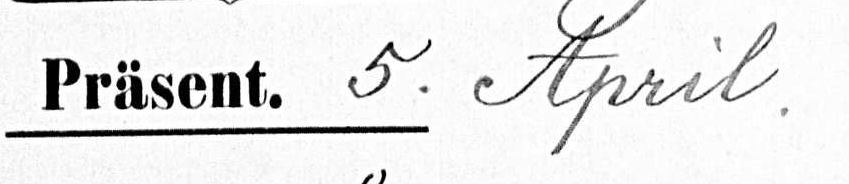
Präsent. 5. April
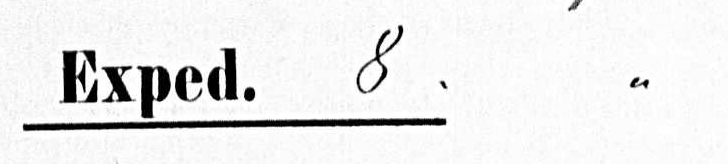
Expedit 8. „
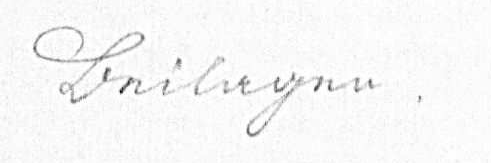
Beilagen
